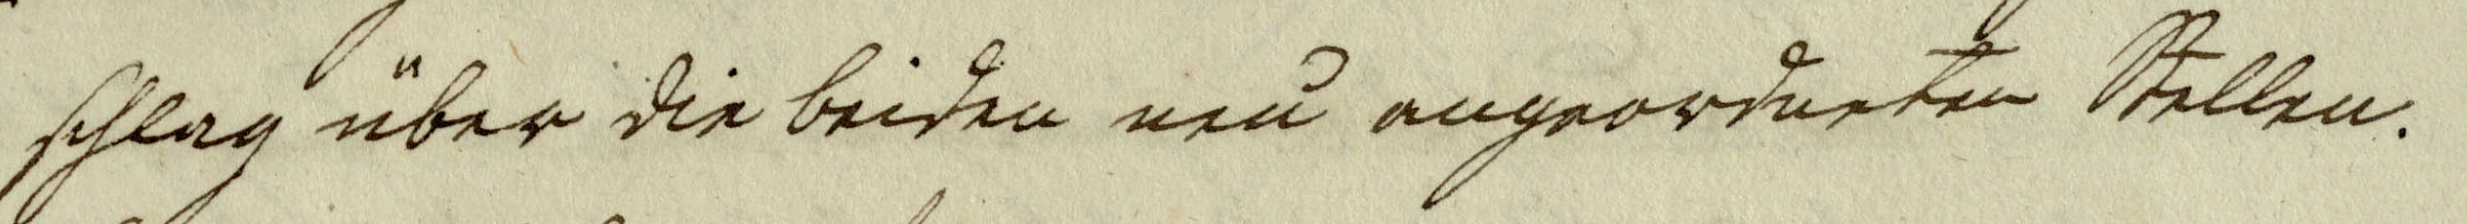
schlag über die beiden angeordneten Stellen.
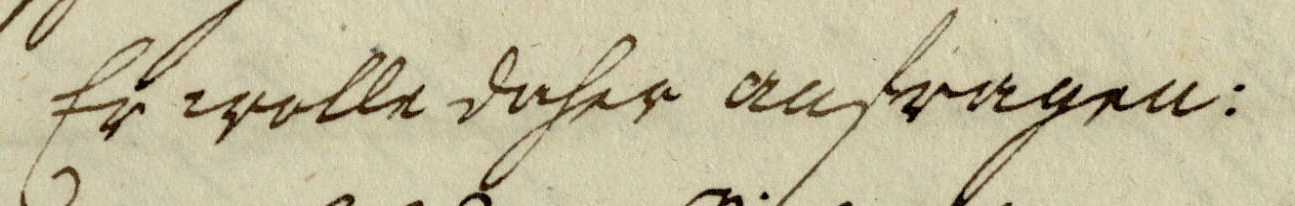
Er wolle daher anfragen:
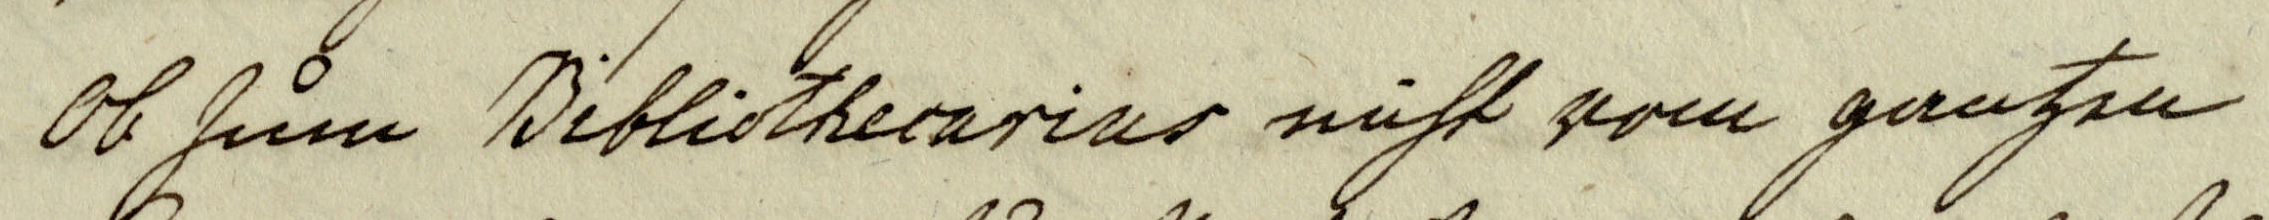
Ob zum Bibliothecarius nicht vom gantzen
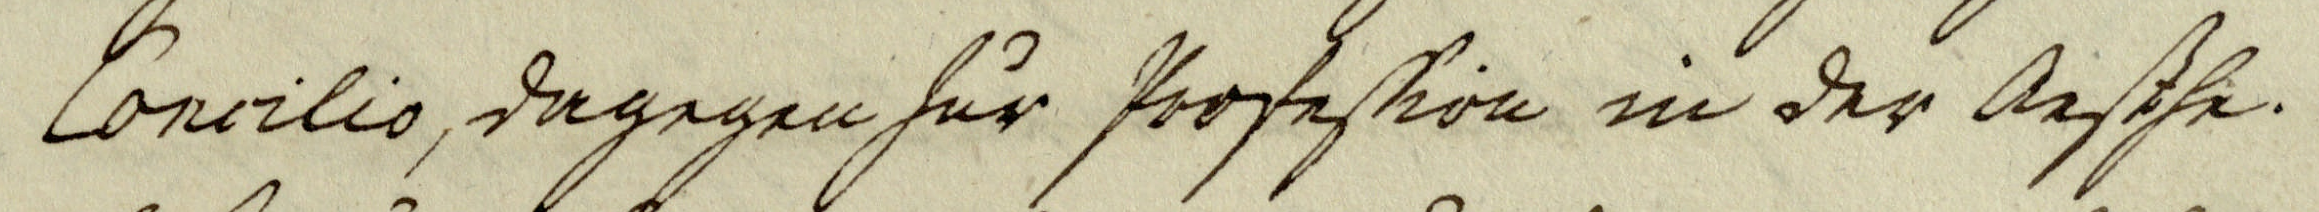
Concilio, dagegen zur Profession in der Aethe¬
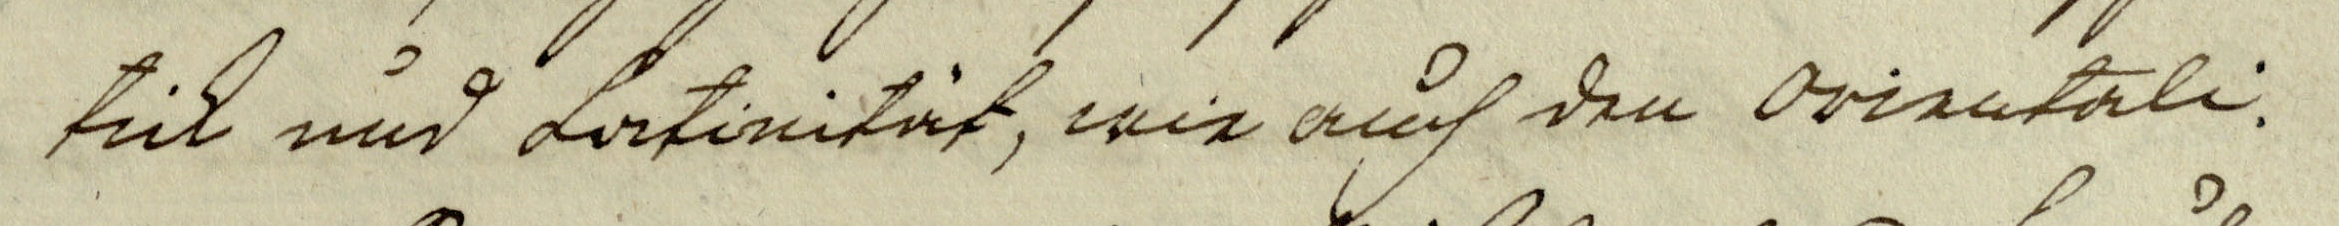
tik und Latinität, wie auch den orientali¬
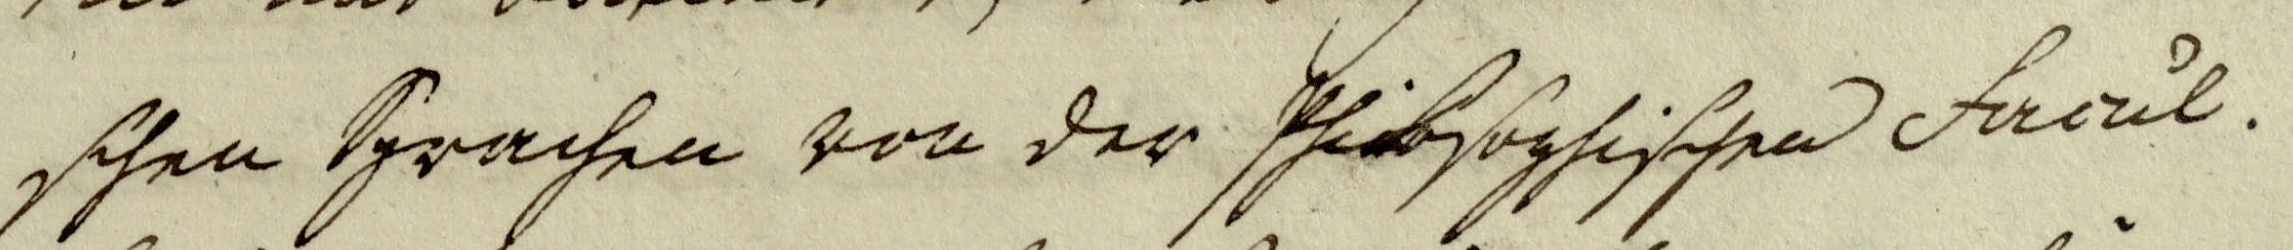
schen Sprachen von der Philosophischen Facul¬
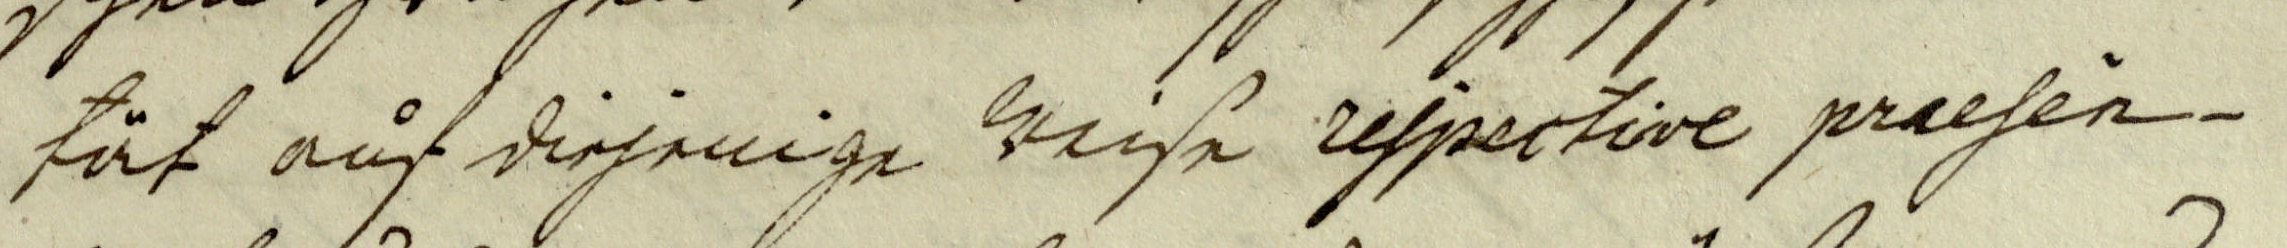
tät auf diejenige Weise respective praesen¬
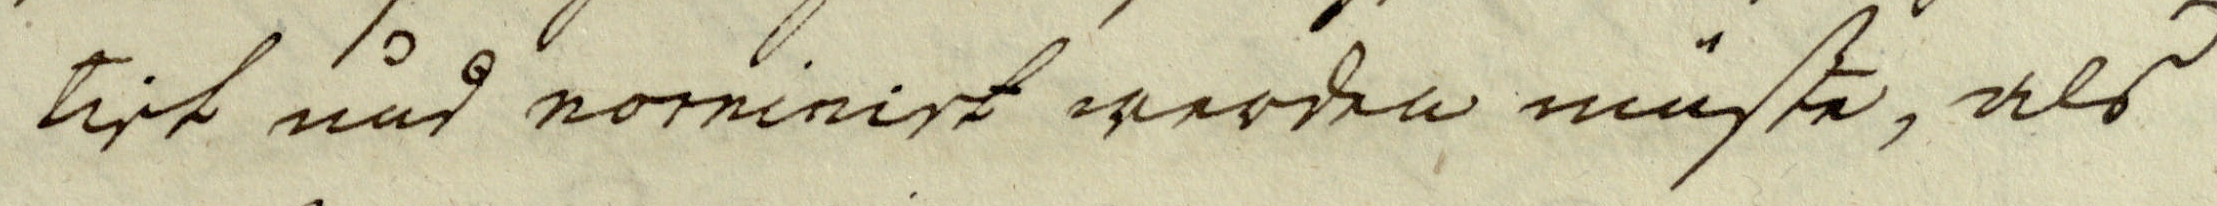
tirt und niminirt werden müsste, als
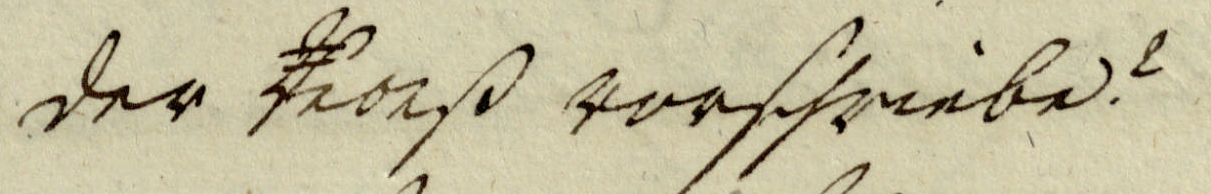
der Receß vorschreibt?
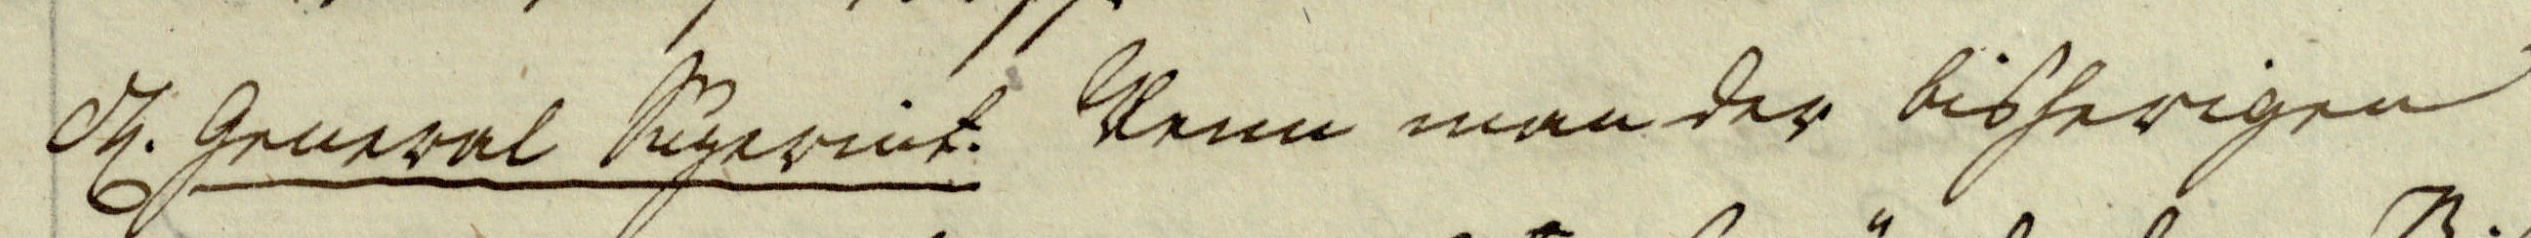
dh. General Superint. Wenn man der bisherigen
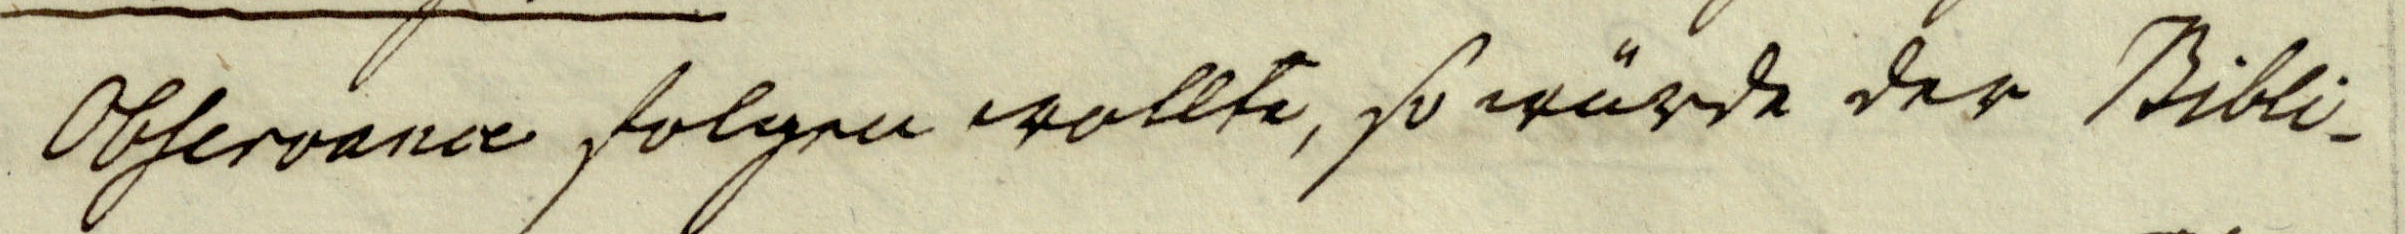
Observance folgen wollte, so würde der Bibli¬
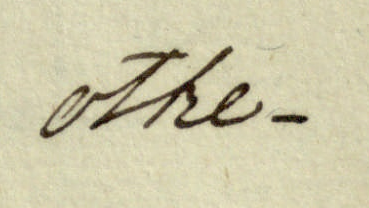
othe¬
